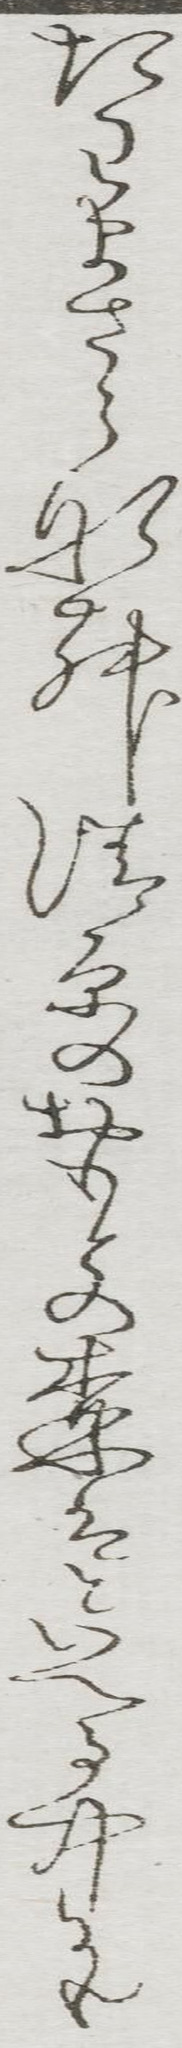たわまさらなむ清原のおもとの森はといへる中にも
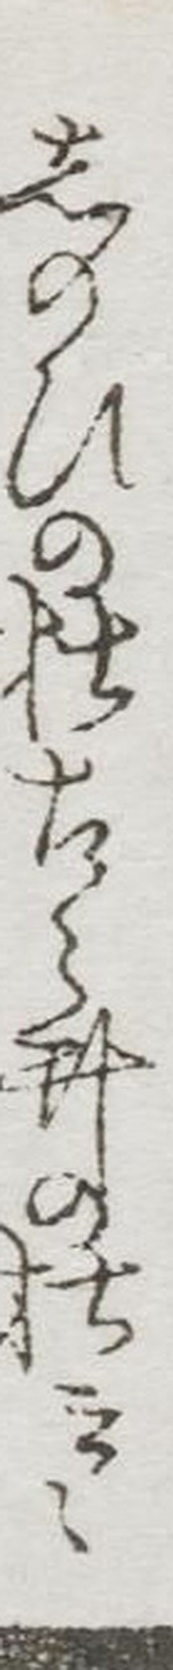しのひの杜こゝゐの杜云々
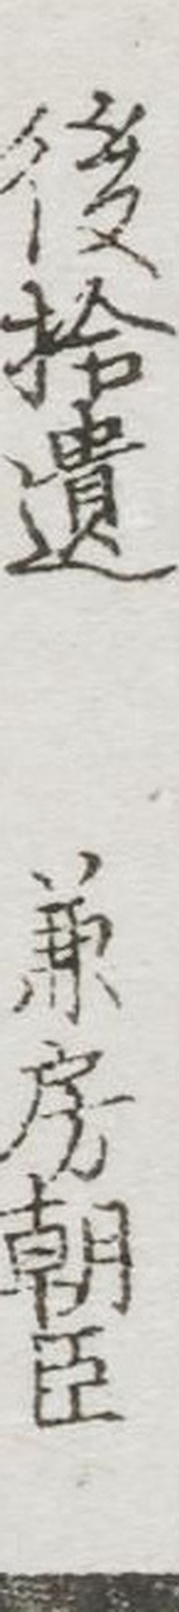後拾遺兼房朝臣
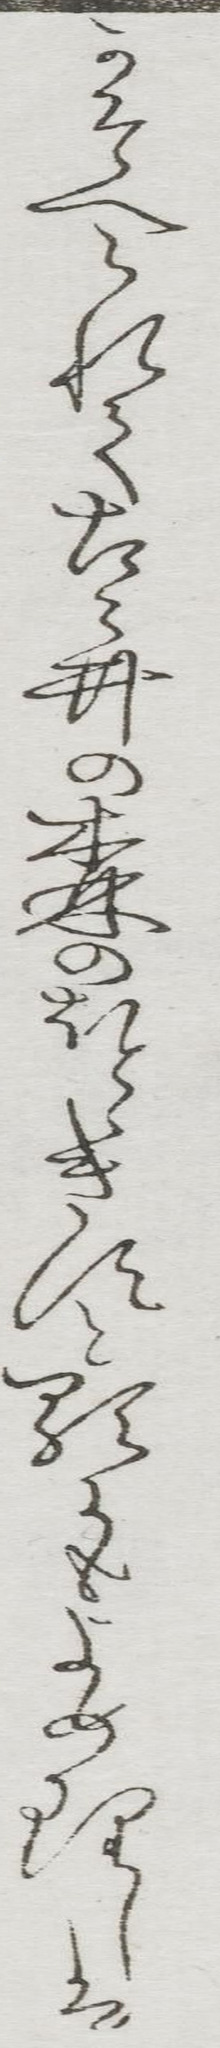かそへられてこゝゐの森のほとゝきすと歌にもよめりしは
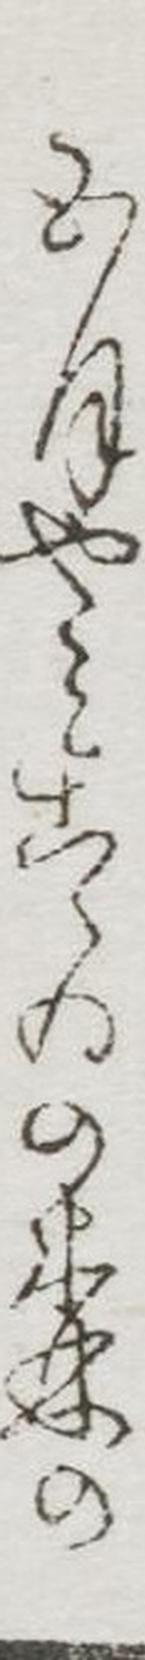五月やみこゝゐの森の
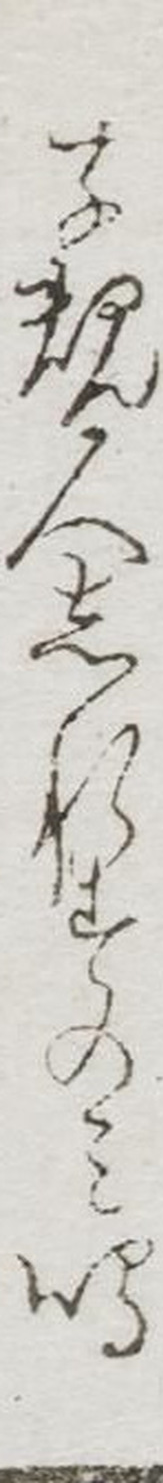子規人しれすのみ鳴
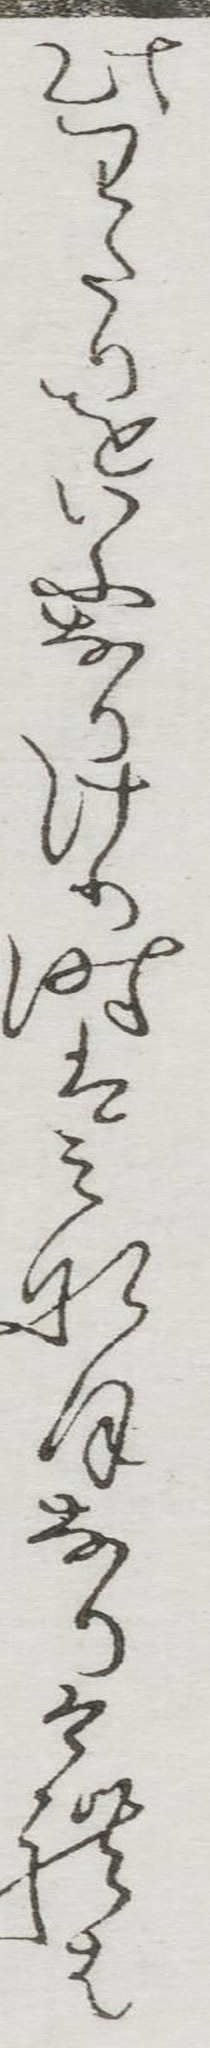此わたりをいふなりけり時はみな月なりけれは
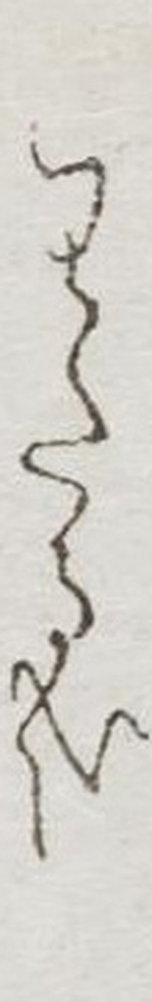わたる哉
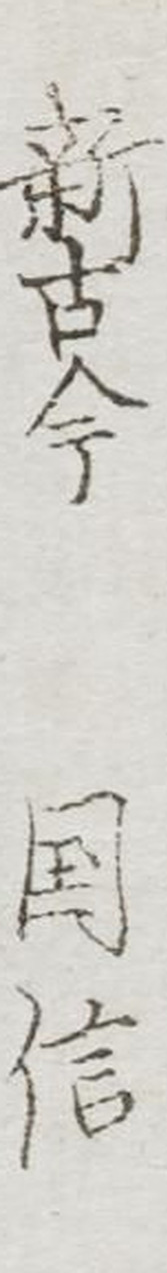新古今国信
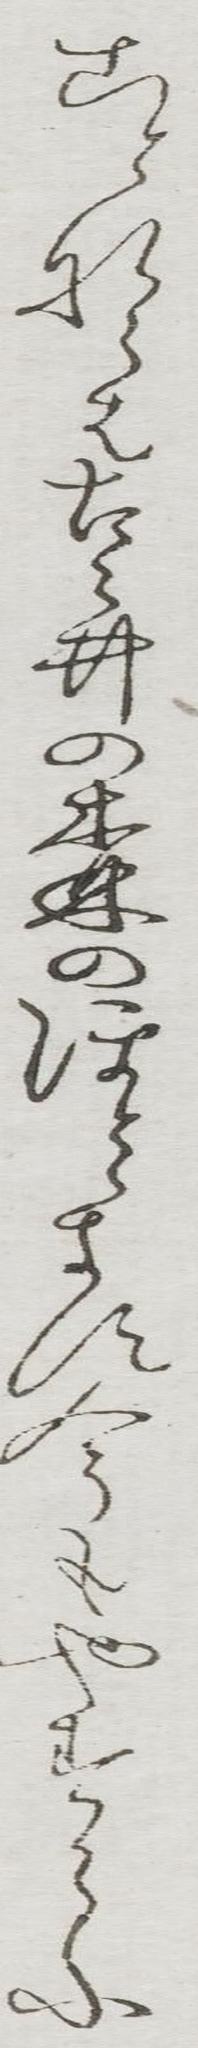ことならはこゝゐの森のほとゝきす今もやすらふ
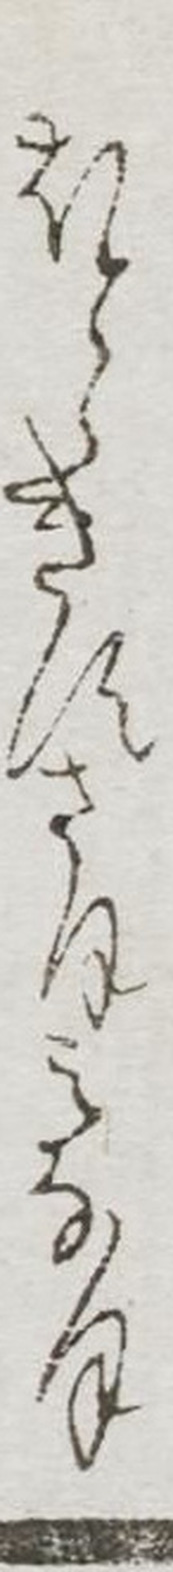ほとゝきすさ月みな月
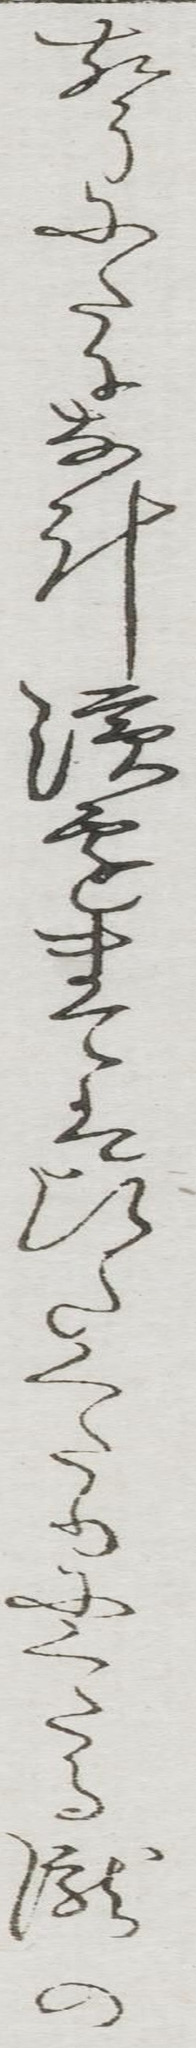声にたになけ浜辺まてはひたくたりにくたる瀧の

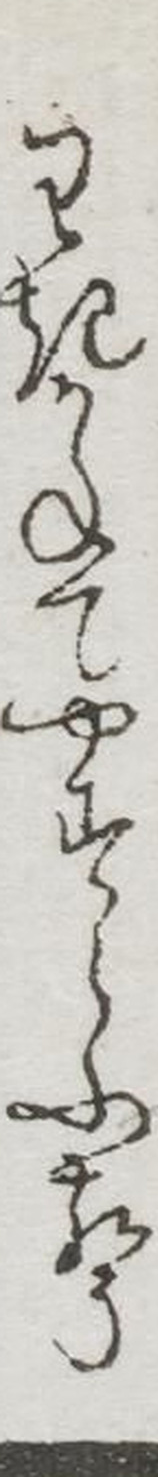わきかねてやすらふ声
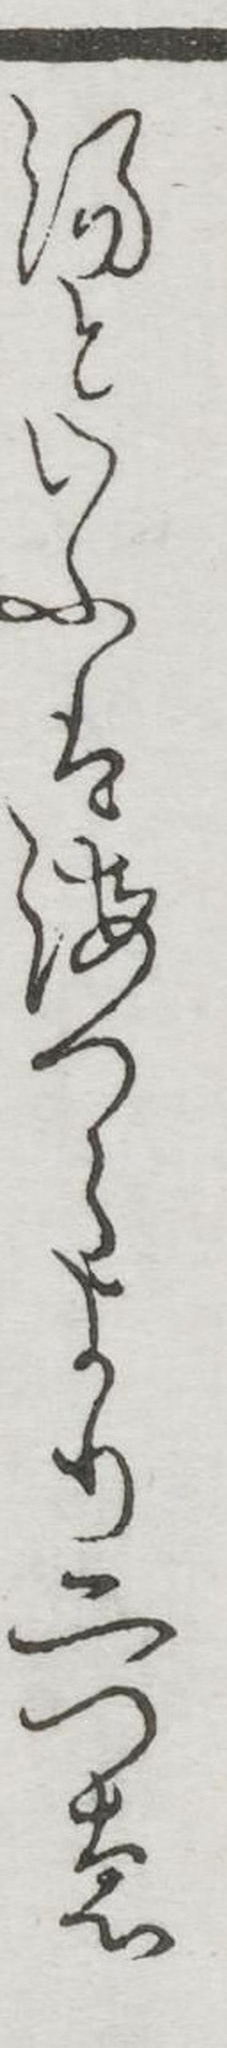湯といふは海つらより二つゑ
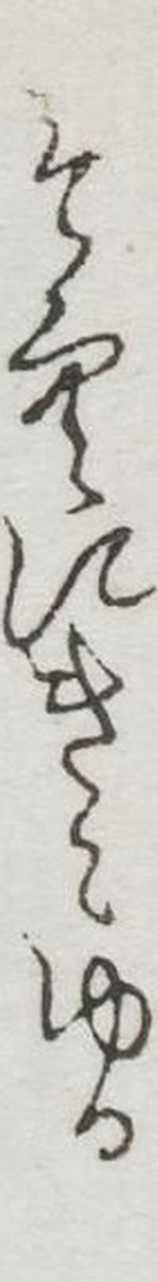そ空にきこゆる
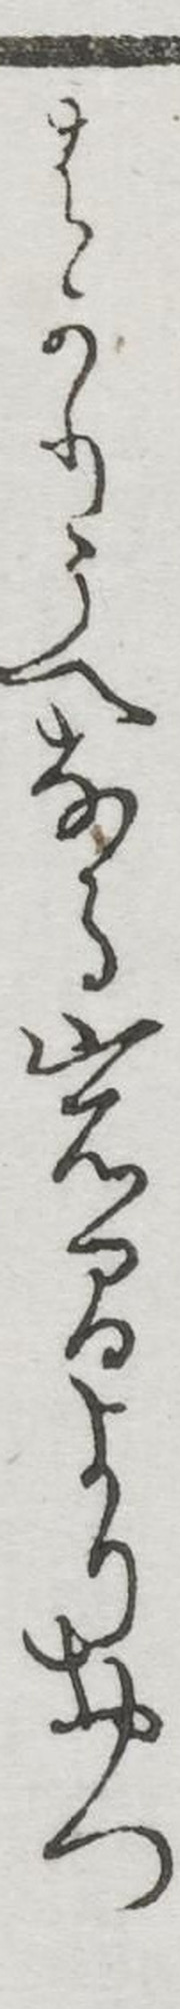はかりうへなる岩間よりおつ
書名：挿画熱海日記　全
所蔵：東京大学地震研究所図書室 Earthquake Research Institute Library, The University of Tokyo, JAPAN
